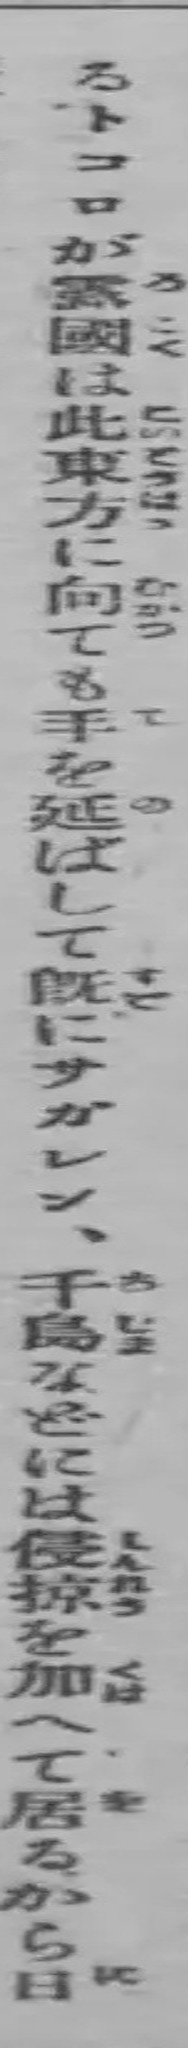るトコロが露国は此東方に向ても手を延ばして既にサガレン、千島などには侵掠を加へて居るから日
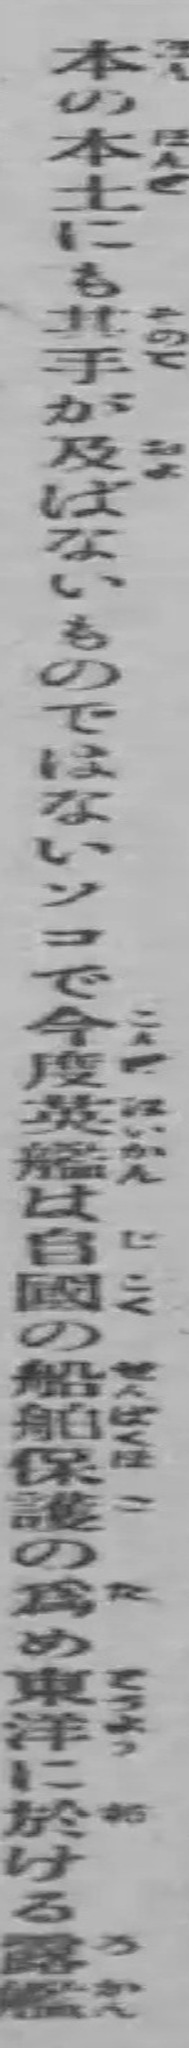本の本土にも其手が及ばないものではないソコで今度英艦は自国の船舶保護の為め東洋に於ける露艦
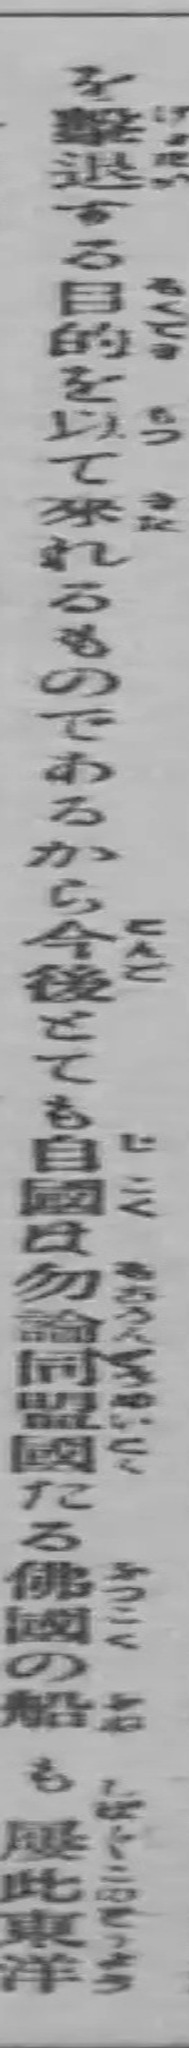を撃退する目的を以て来れるものであるから今後とても自国は勿論同盟国たる仏国の船も屡此東洋
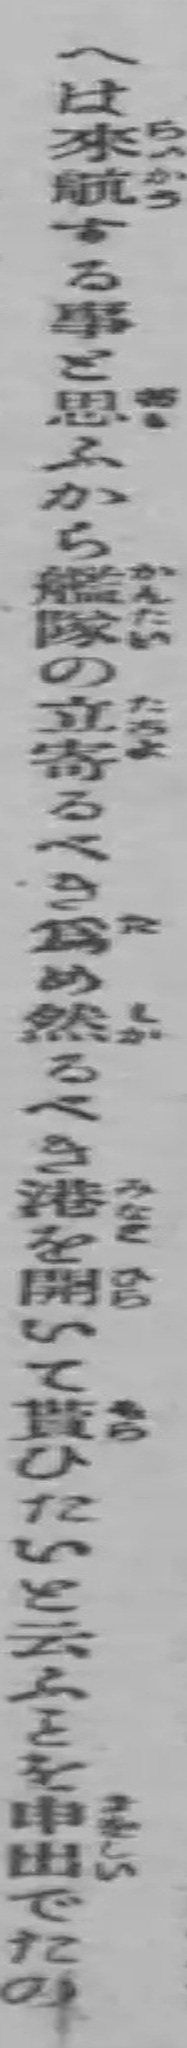へは来航する事と思ふから艦隊の立寄るべき為め然るべき港を開いて貰ひたいと云ふことを申出でたの
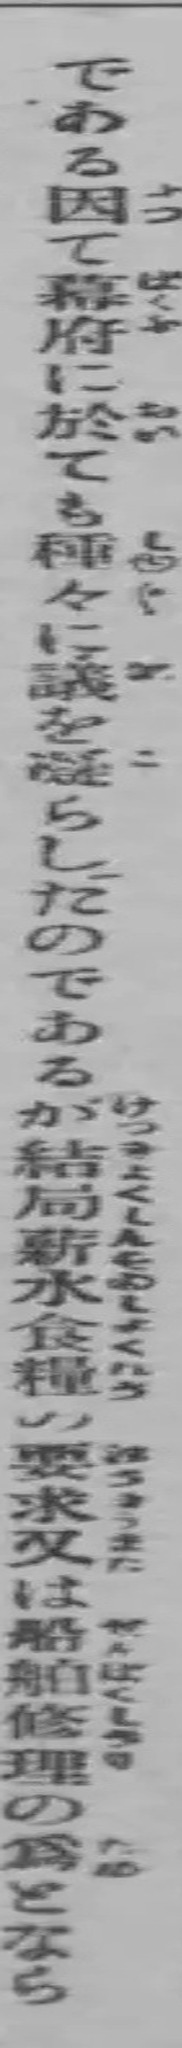である因て幕府に於ても種々に議を凝らしたのであるが結局薪水食糧の要求又は船舶修理の為となら
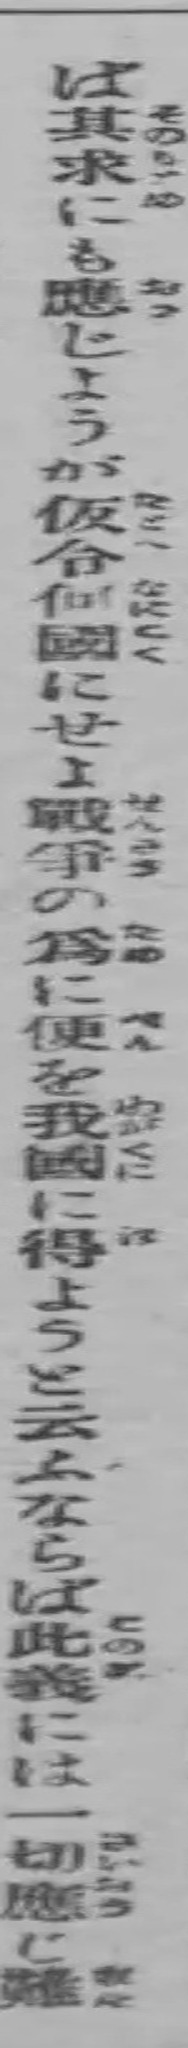ば其求にも応じようが仮令何国にせよ戦争の為に便を我国に得ようと云ふならば此義には一切応じ難
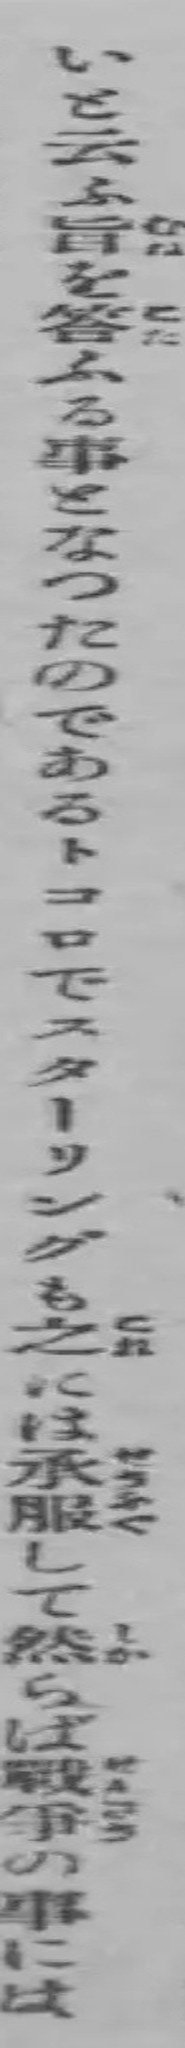いと云ふ旨を答ふる事となつたのであるトコロでスターリングも之には承服して然らば戦争の事には
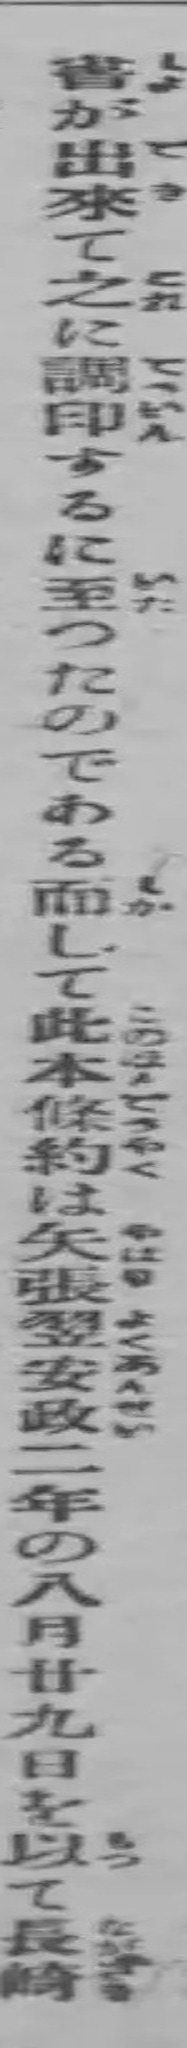書が出来て之に調印するに至つたのである而して此本条約は矢張翌安政二年の八月廿九日を以て長崎
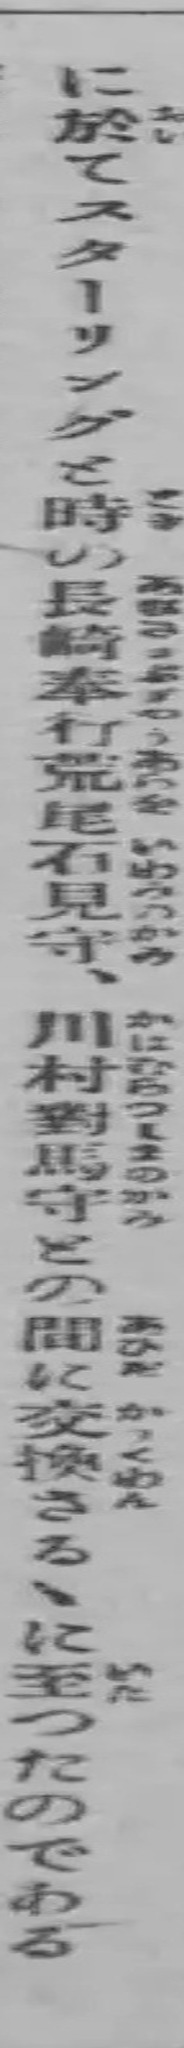に於てスターリングと時の長崎奉行荒尾石見守、川村対馬守との間に交換さるゝに至つたのである
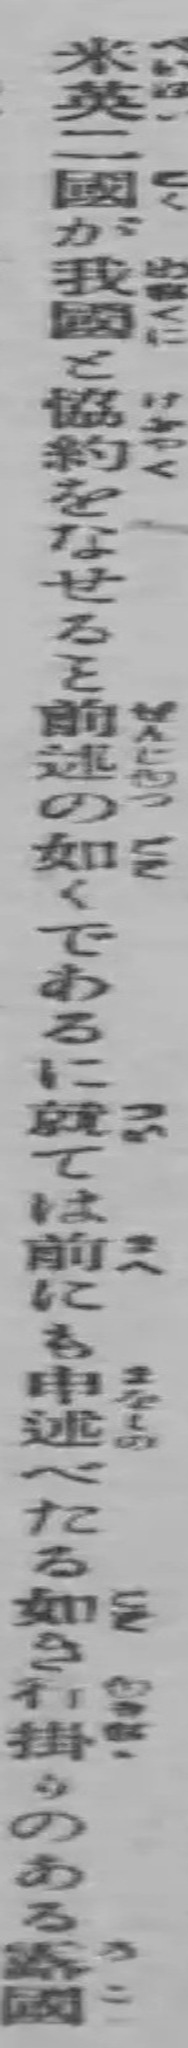露使の再航米英二国が我国と協約をなせること前述の如くであるに就ては前にも申述べたる如き行掛りのある露国
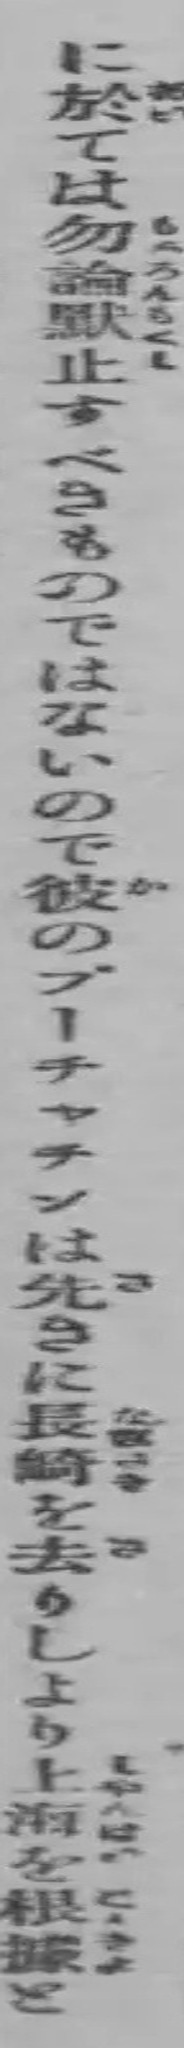に於ては勿論黙止すべきものではないので彼のプーチヤチンは先きに長崎奉行を去りしより上海を根拠と
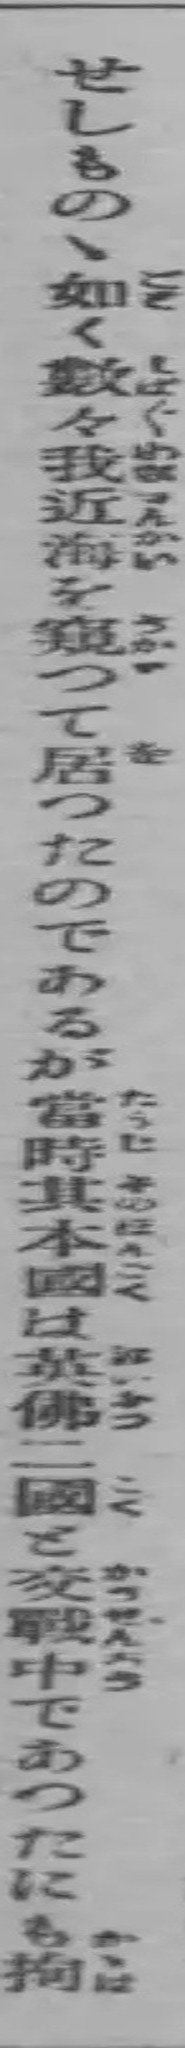せしものゝ如く数々我近海を窺つて居つたのであるが当時其本国は英仏二国と交戦中であつたにも拘

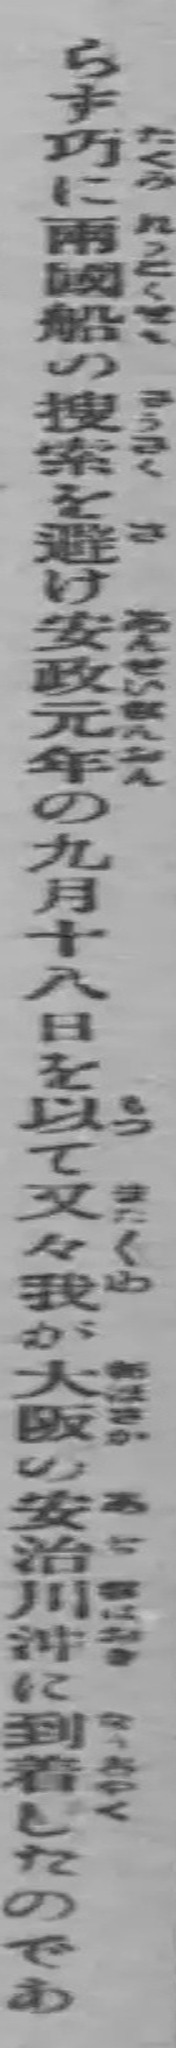らず巧に両国船の捜索を避け安政元年の九月十八日を以て又々我が大阪の安治川沖に到着したのであ
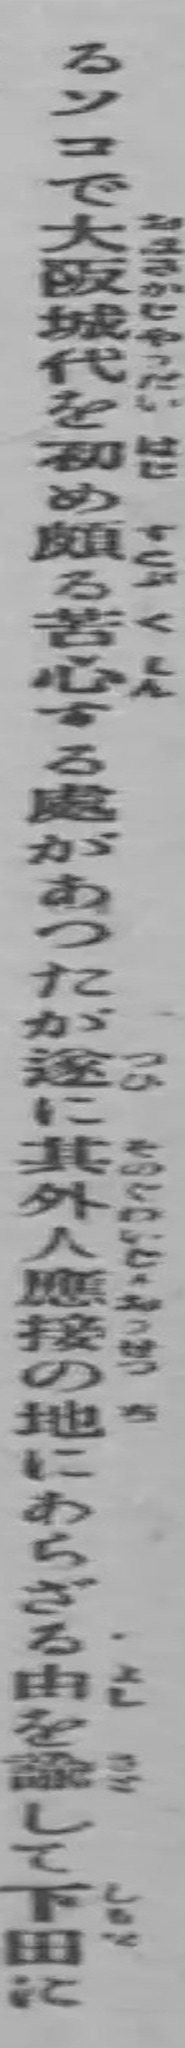るソコで大阪城代を初め頗る苦心する処があつたが遂に其外人応接の地にあらざる由を諭して下田に
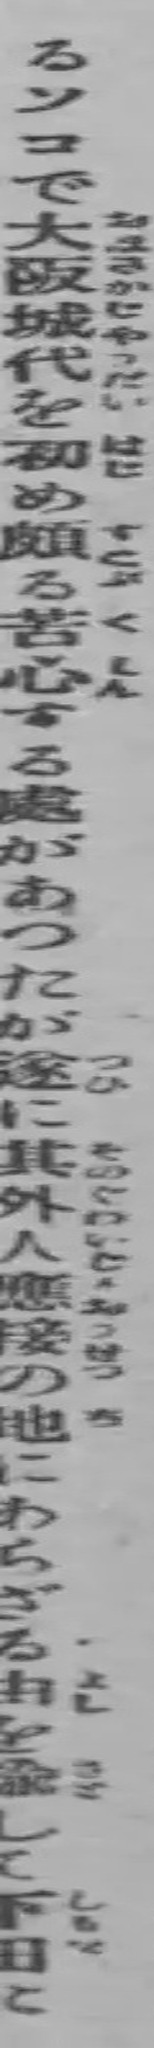るソコで大阪城代を初め頗る苦心する処があつたが遂に其外人応接の地にあらざる由を諭して下田に
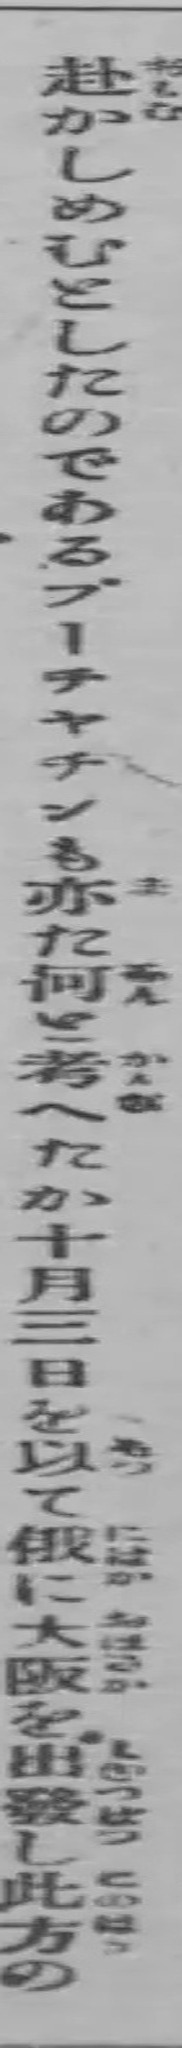赴かしめむとしたのであるプーチヤチンも亦た何と考へたか十月三日を以て俄に大阪を出発し此方の
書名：豊橋市史談
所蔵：国立国会図書館 National Diet Library, JAPAN
